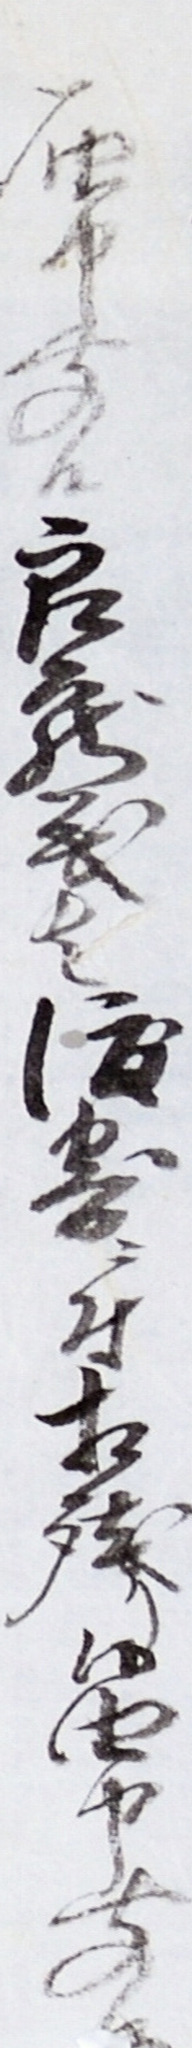届申聞候良蔵義は渡寄に付相残り候由申聞候
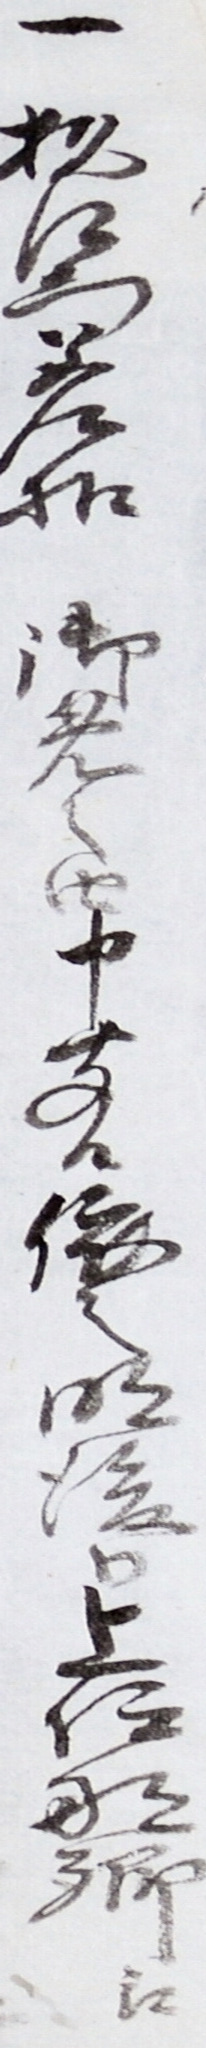一松左衛門差扣御免之由申聞候依之明後申上伊那郷江
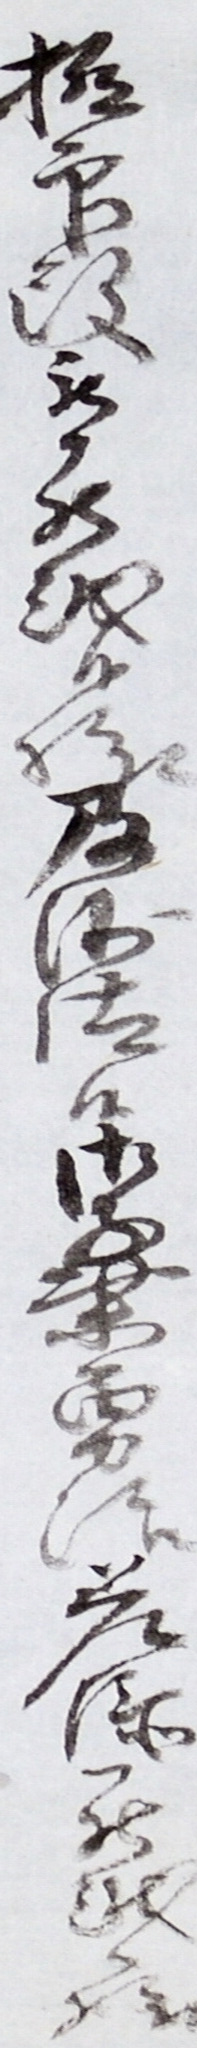極印改被罷越候様及沙汰候御子柴勇治当差添罷越候様
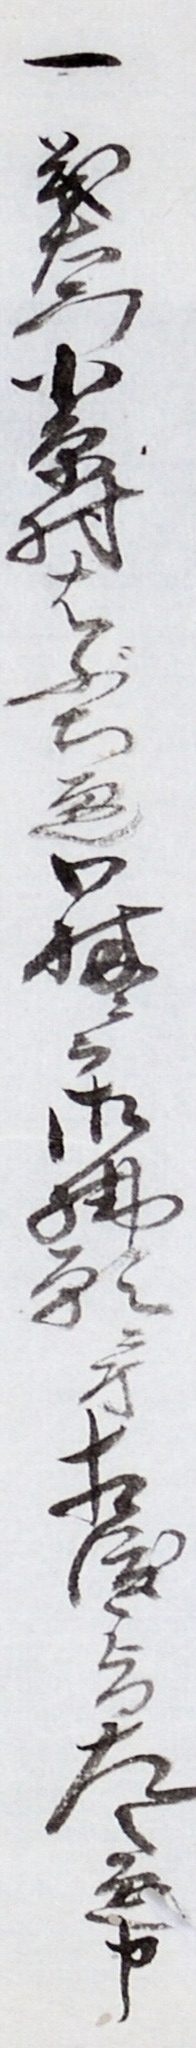一義右衛門小原村はぶち通御林に而御払職願ニ付相渡三間左之通申
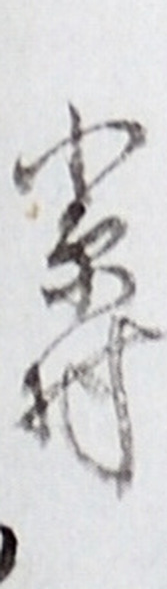小原村
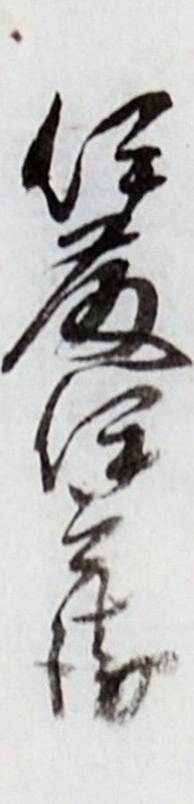伊藤伊兵衛
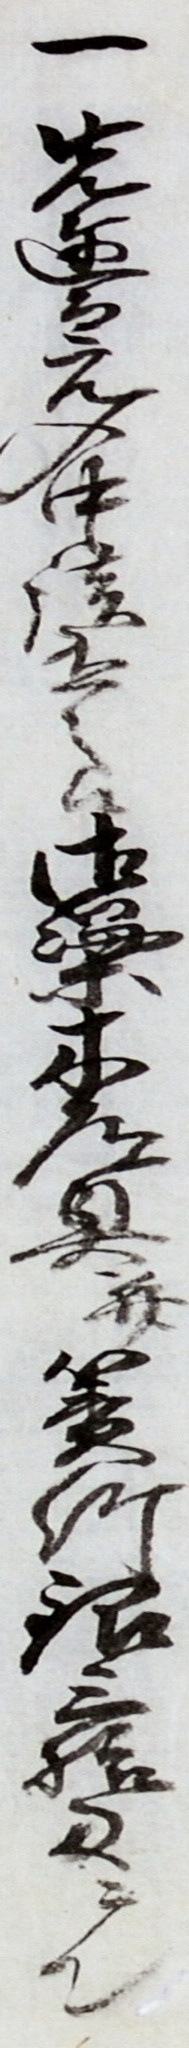一先達而元〆中談有之候御簗木道具并簀竹銀三拾匁ニて
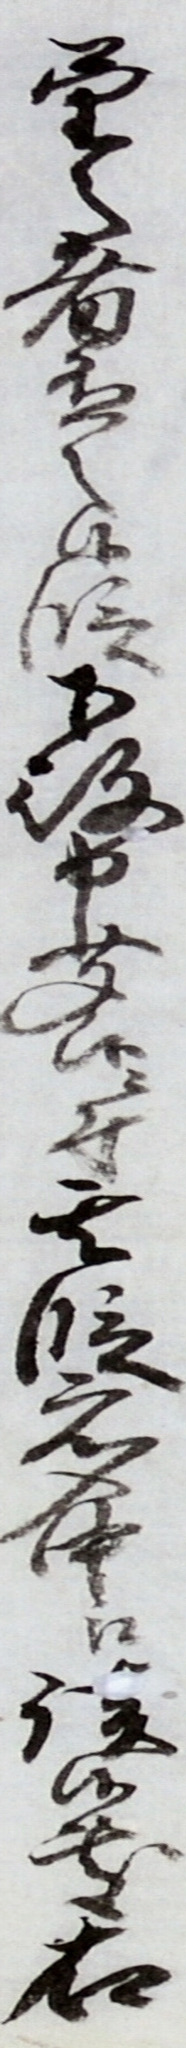重之者有之候段下役申聞候ニ付其段元〆江候処右
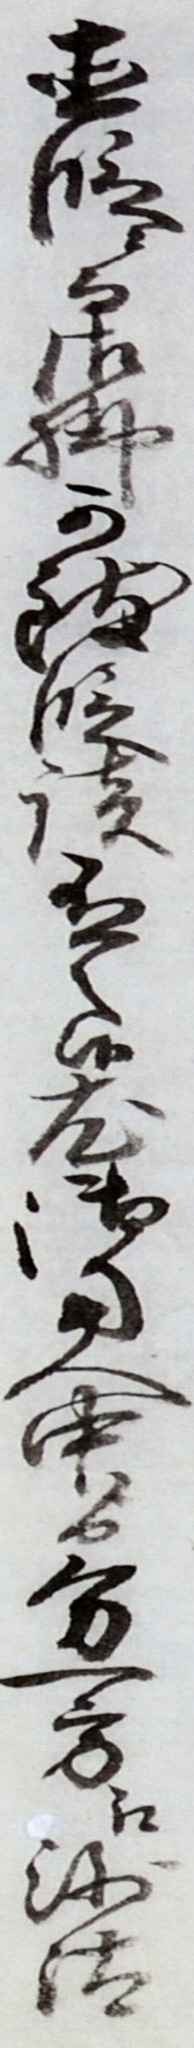直段ニ而御払可致談有之候尤御用人中より方一方江沙汰
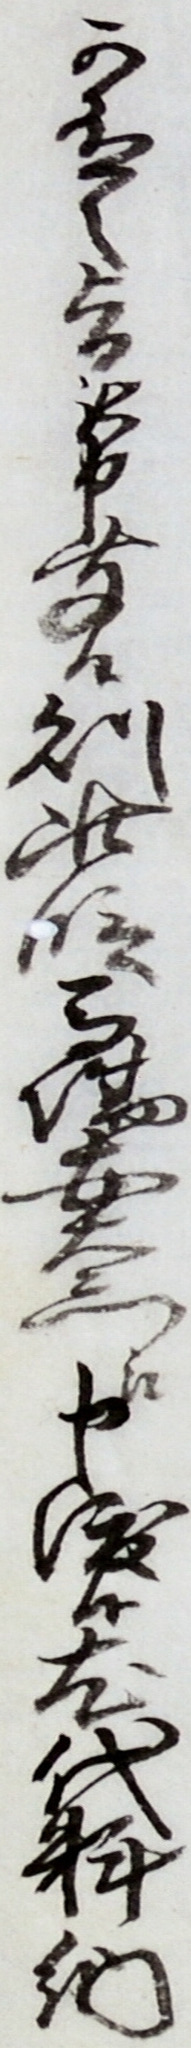可有之旨被申聞候則此段馬場安右衛門江申渡候尤代料納

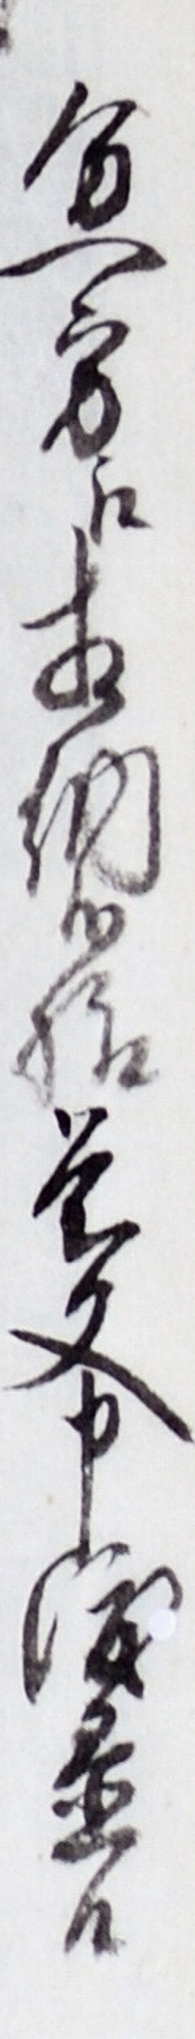分一方江相納候様是又申渡置候
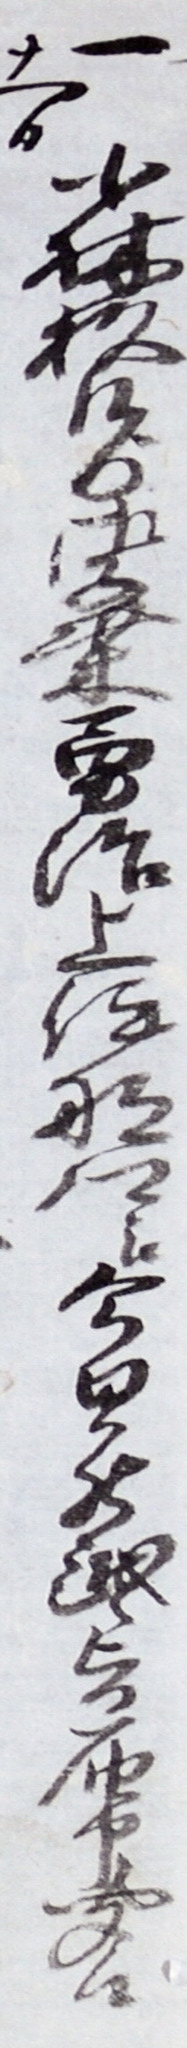一小林杉左衛門御子柴勇治上伊那郷江今日罷越候旨届申聞候
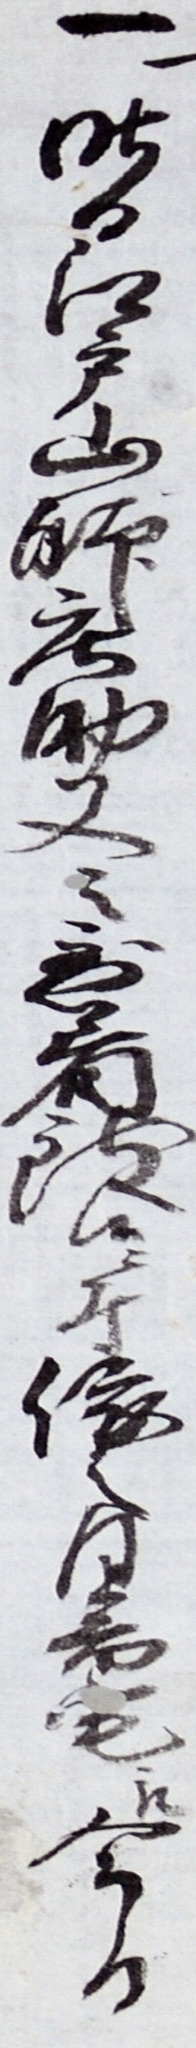一昨日江戸山師庄助又々到着致候ニ付依之月番宅江今日
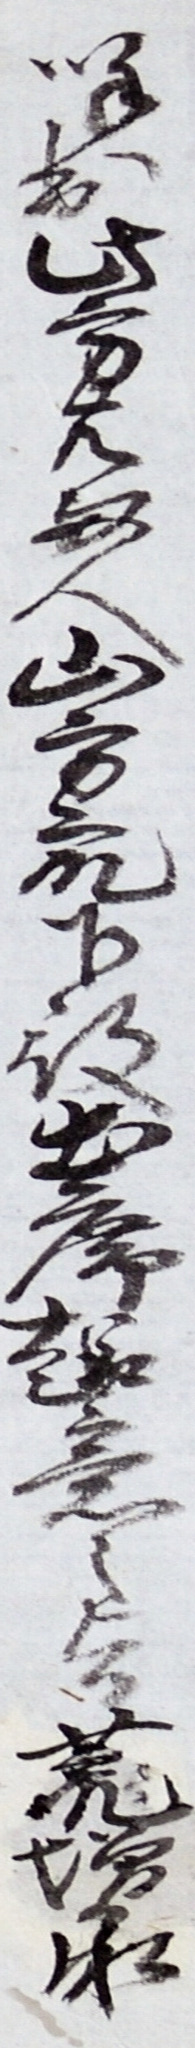呼出此方共両人山方衆下役出席趣意之旨荒増承
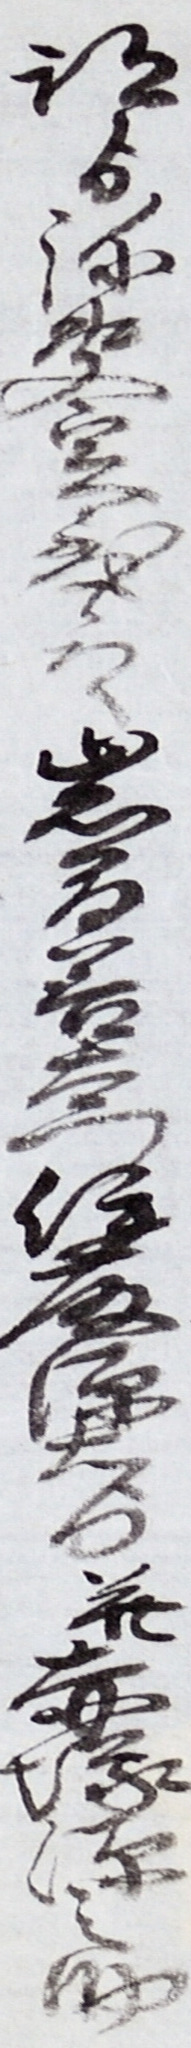跡より弥実岩間善右衛門伊藤源右衛門并赤塚源之助
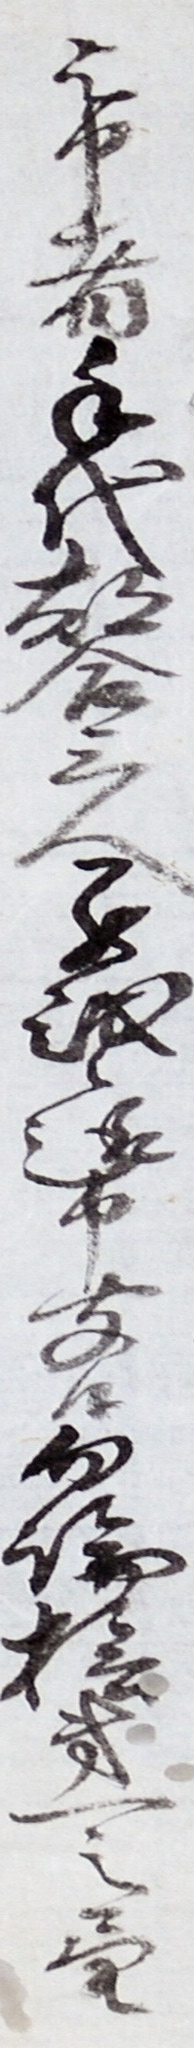被申者手代都合三人罷越候趣申聞候勿論桧第一之
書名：御山奉行御用控
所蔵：伊那市立高遠町図書館・合同会社AMANE
